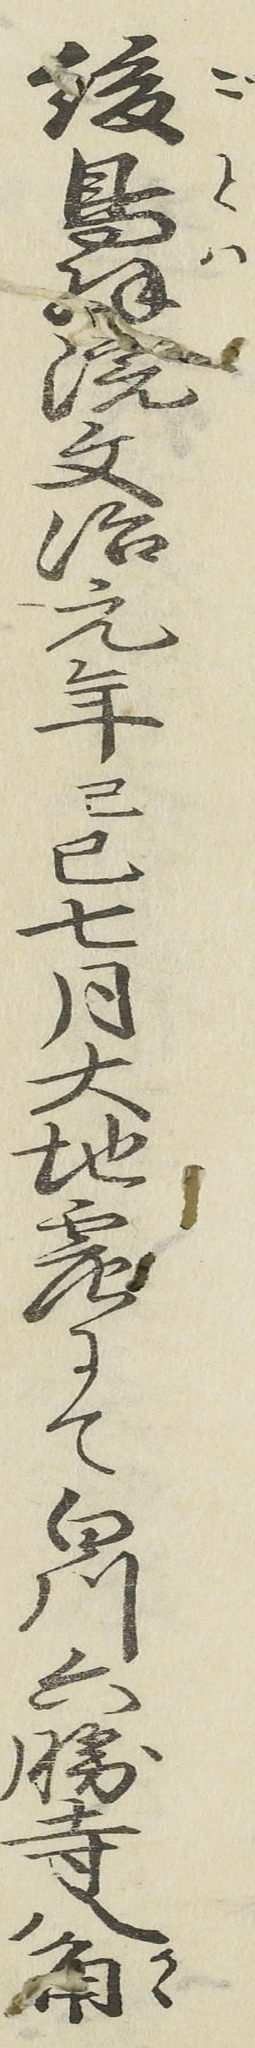後鳥羽院文治元年己巳七月大地震にて白川六勝寺八角
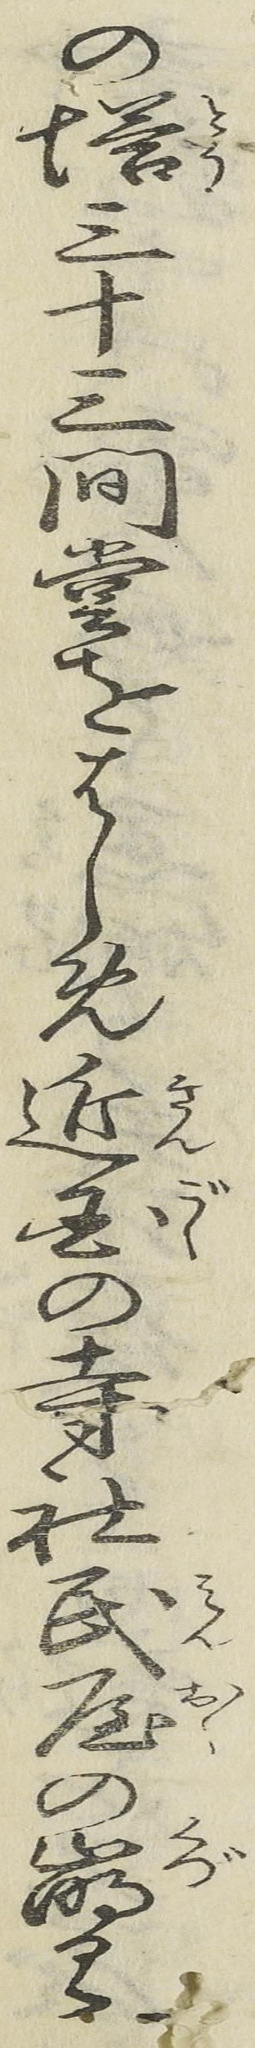の塔三十三間堂をはしめ近国の寺社民屋の崩るゝ

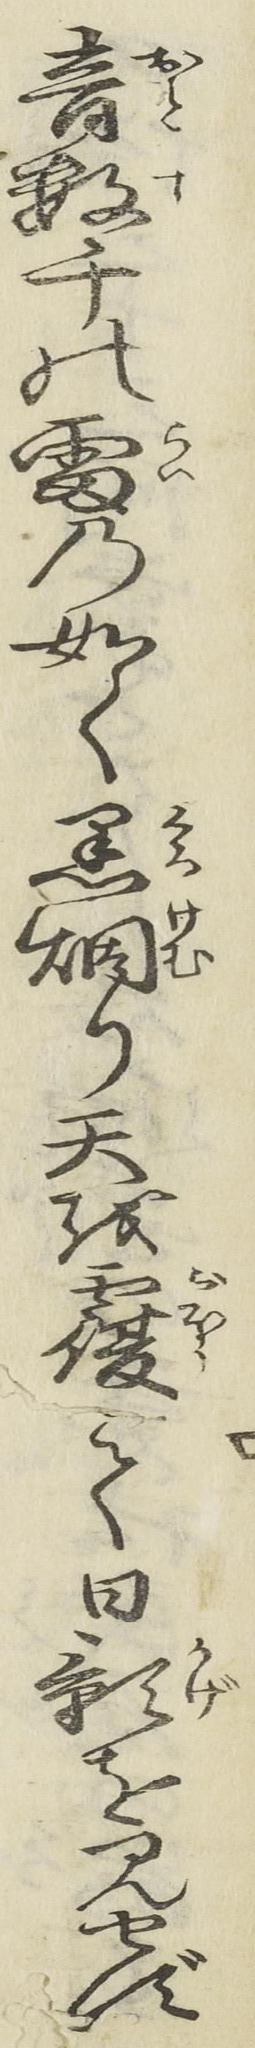音数千の雷の如く黒煙り天を覆て日影を見せず
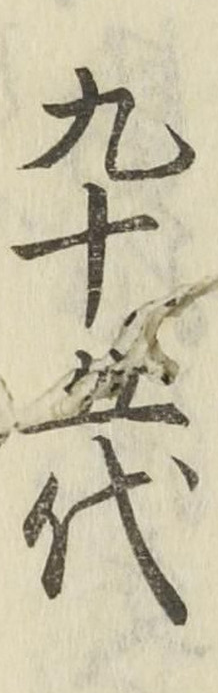九十五代
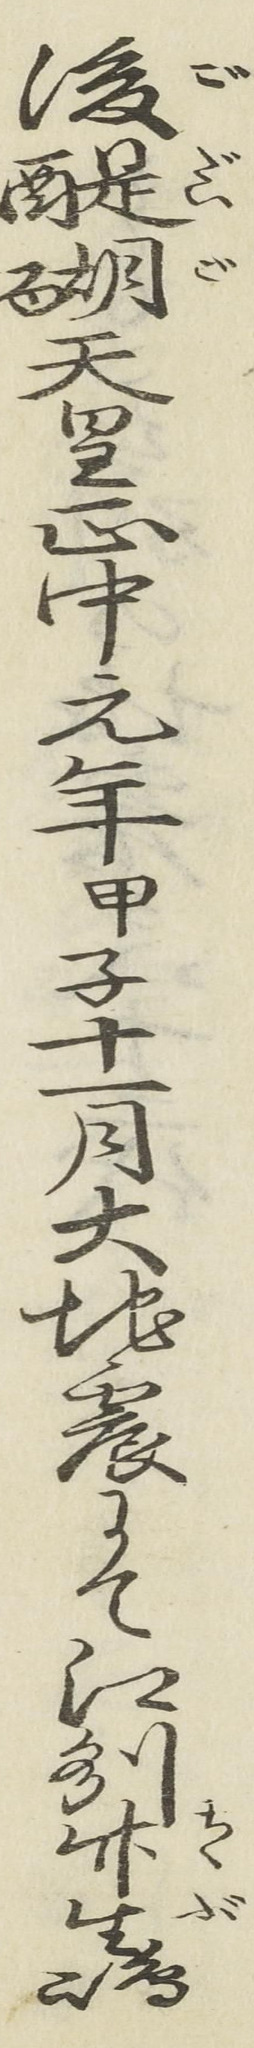後醍醐天皇正中元年甲子十一月大地震にて江州竹生嶋
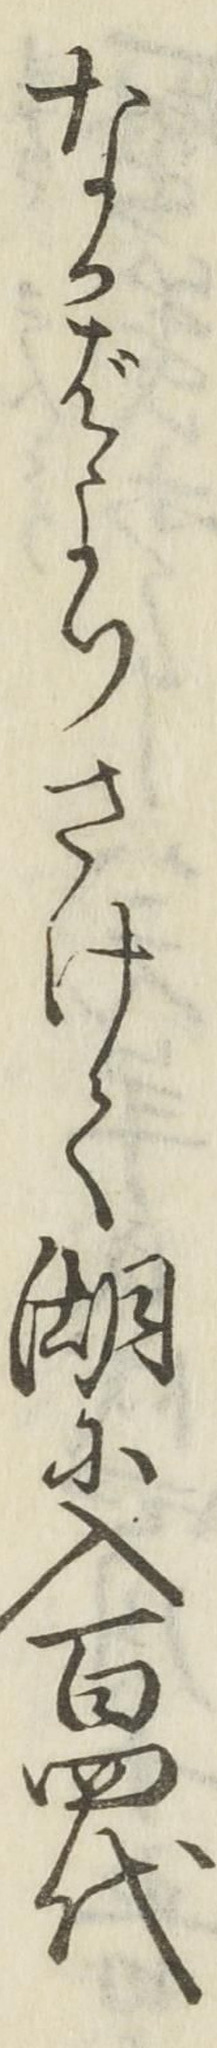なかばよりさけて湖に入百四代
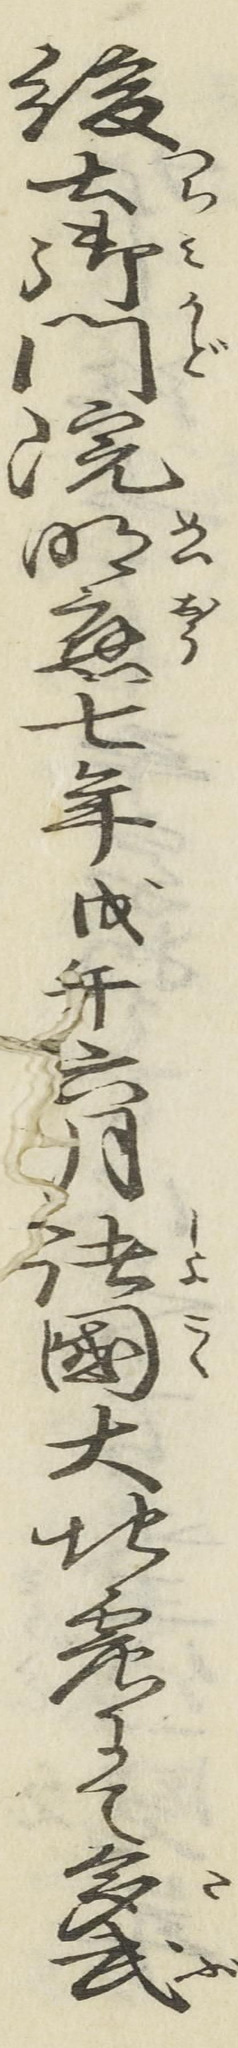後土御門院明応七年戊午六月諸国大地震にて多武
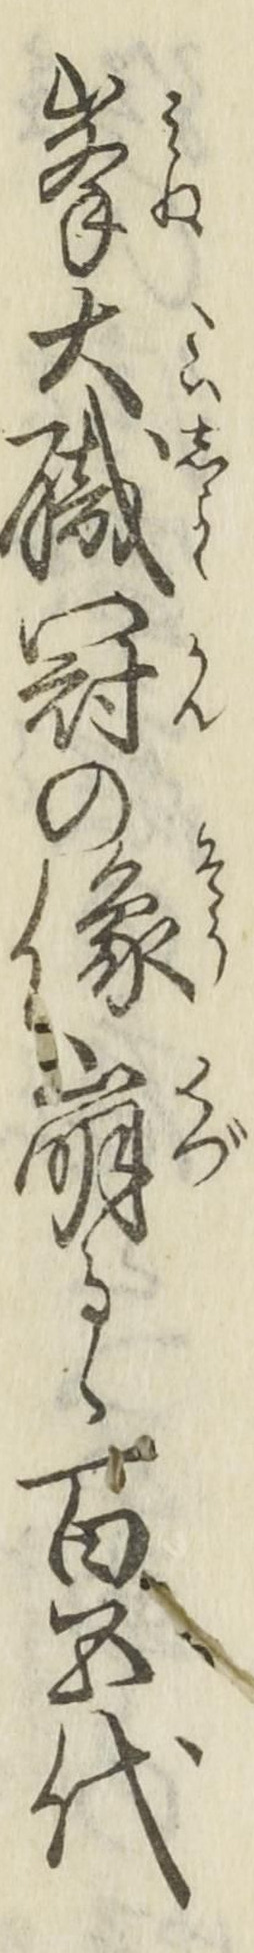峯大職冠の像崩るゝ百五代
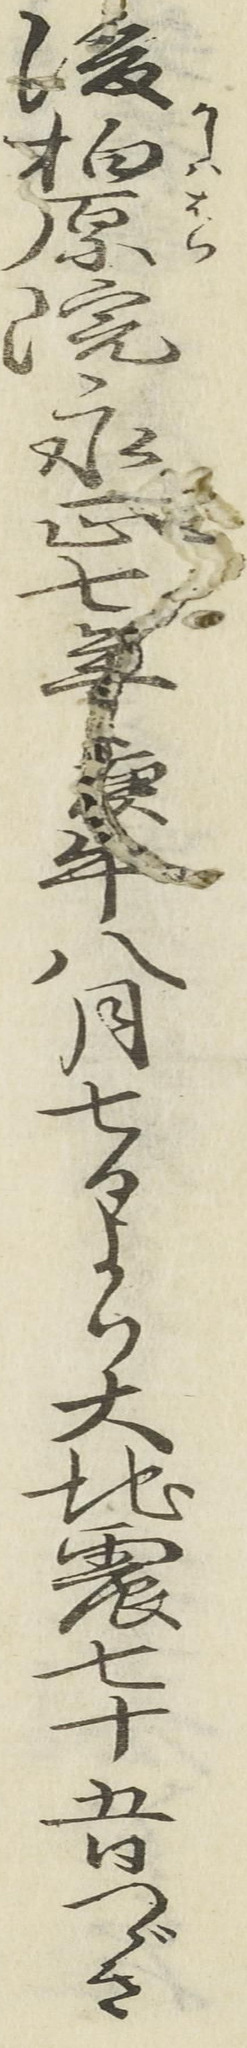後柏原院永正七年庚午八月七日より大地震七十五日つゞき
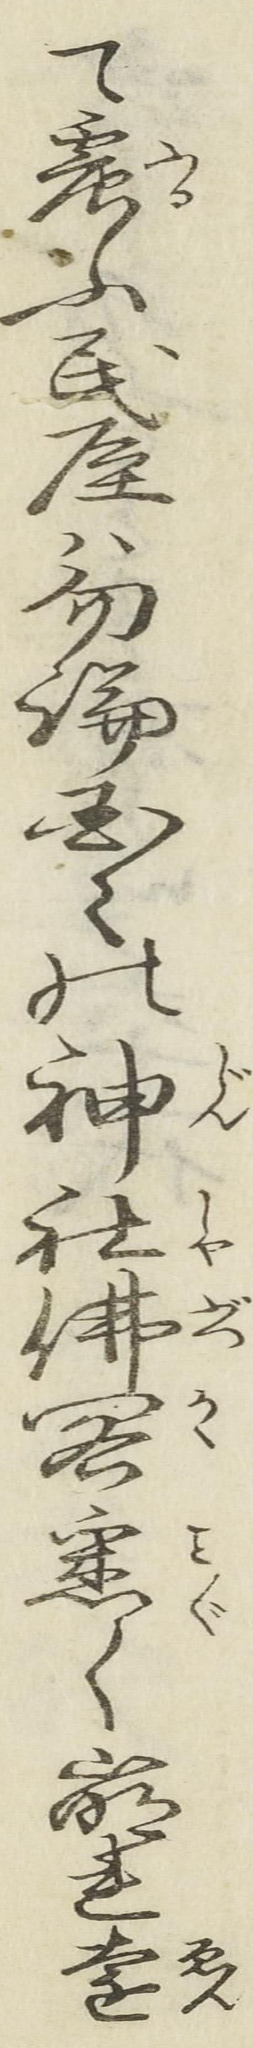て震ふ民屋は勿論国々の神舎仏閣悉く崩れ遠
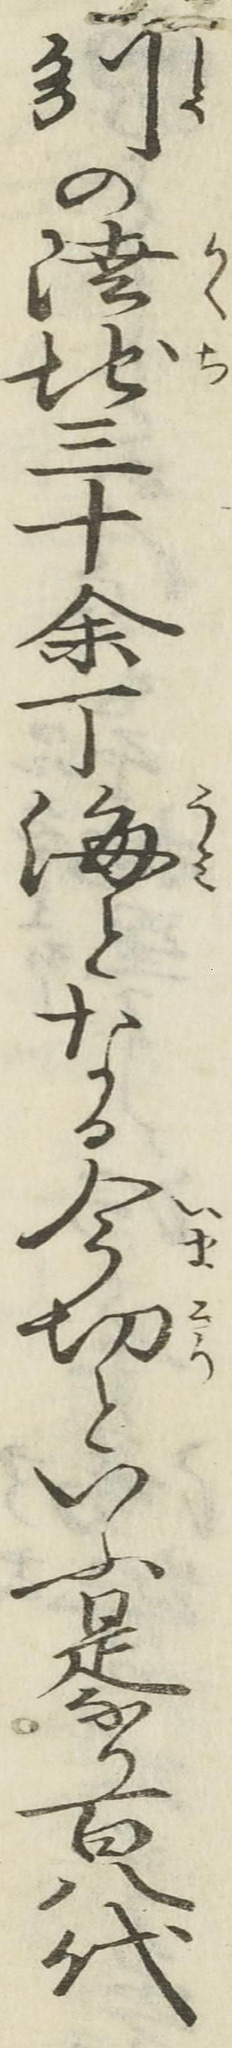州の陸地三十余丁海となる今切といふ是なり百八代
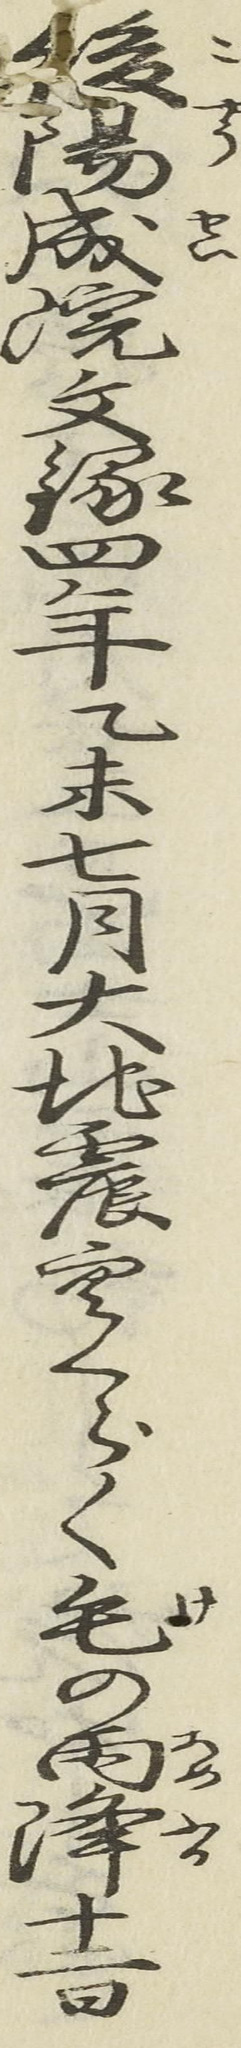御陽成院文禄四年乙未七月大地震空くらく毛の雨降十二日
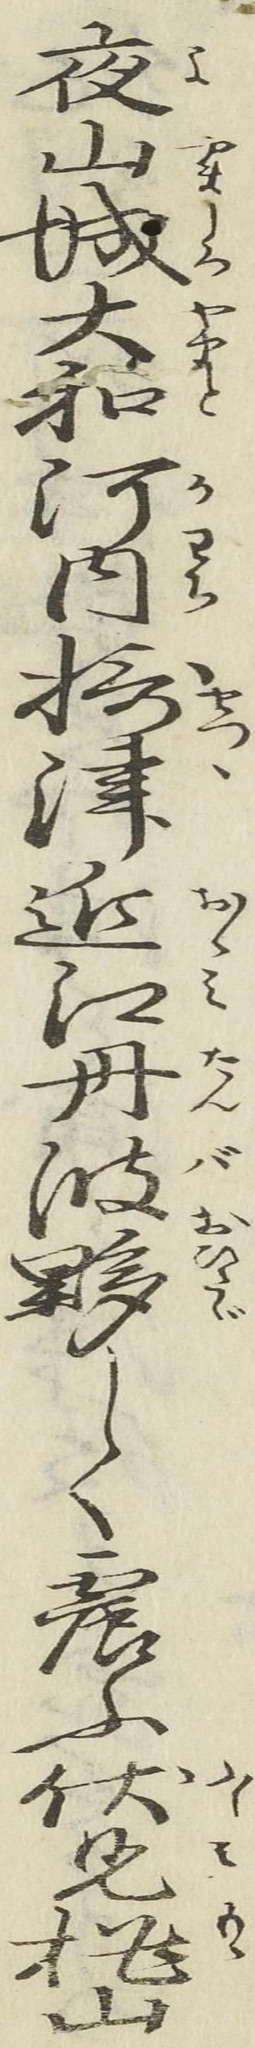夜山城大和河内摂津近江丹波夥しく震ふ伏見桃山
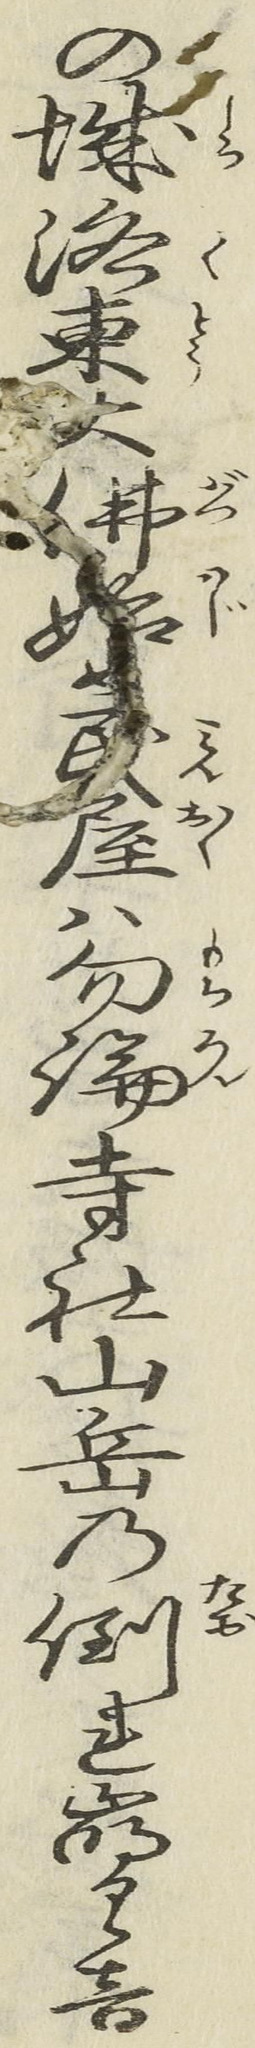の城洛東大佛始め民屋は勿論寺社山岳の倒れ崩るゝ音
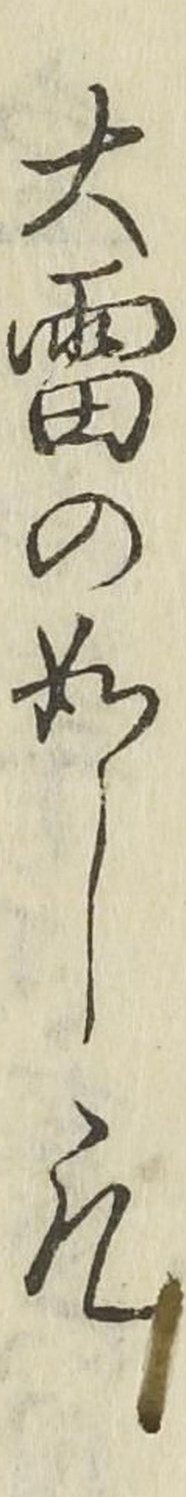大雷の如し凡
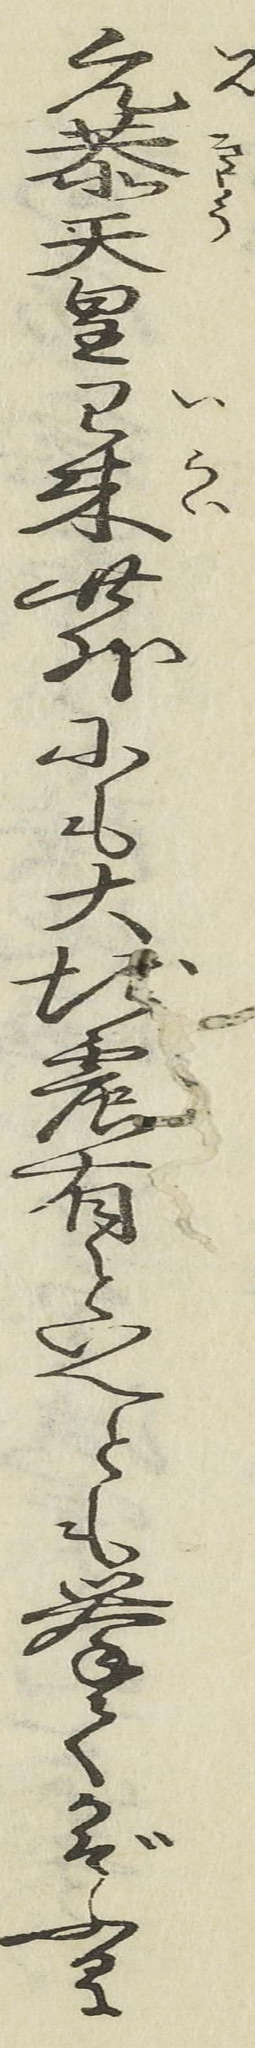允恭天皇己来此外にも大地震有といへとも挙てかぞふるに
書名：震雷考説　全
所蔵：東京大学地震研究所図書室 Earthquake Research Institute Library, The University of Tokyo, JAPAN
